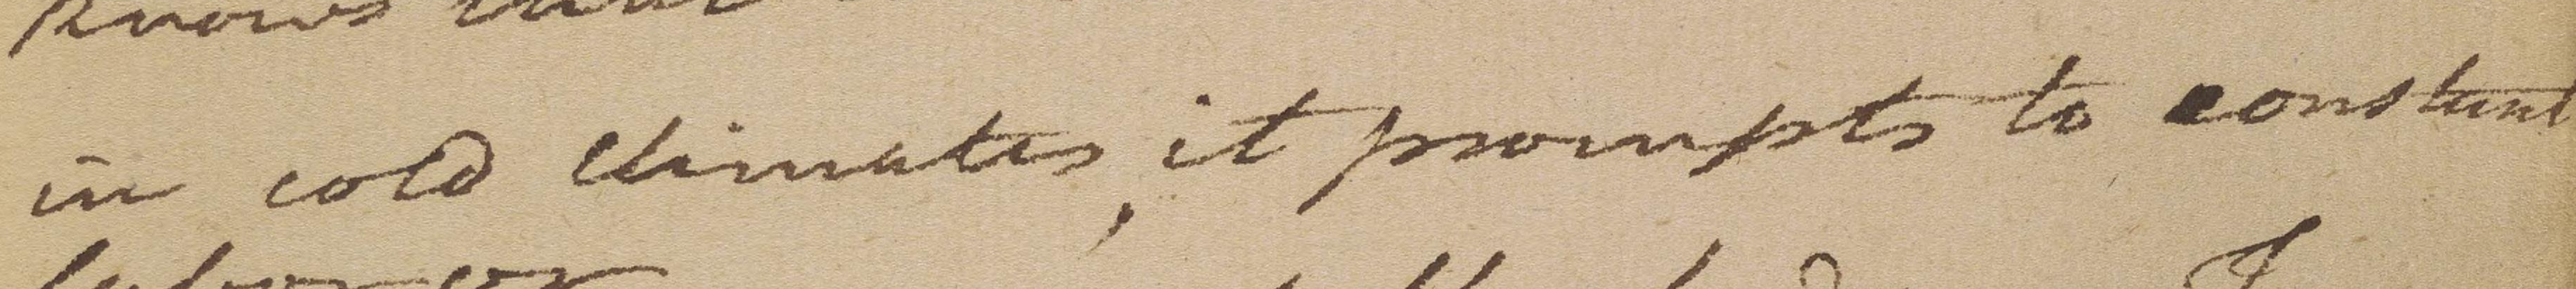in cold climates, it prompts to constant
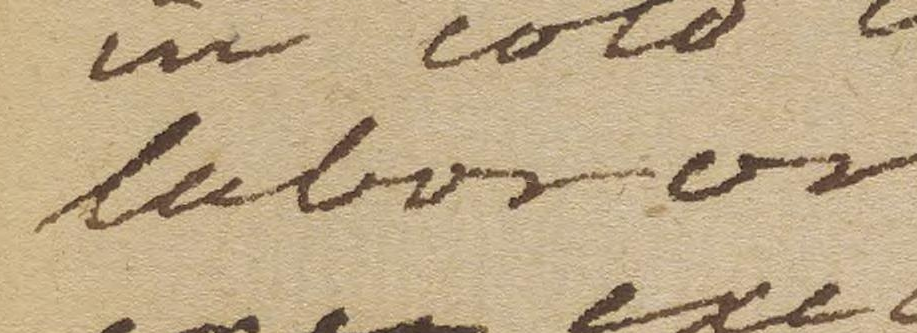labor or
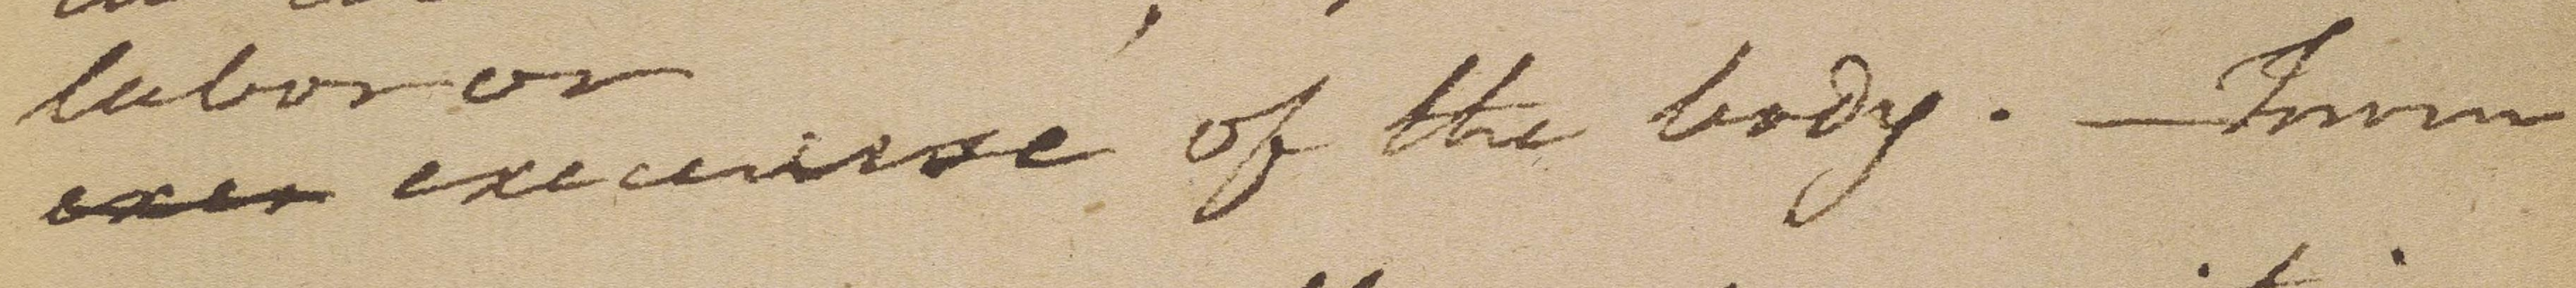exercise of the body. From
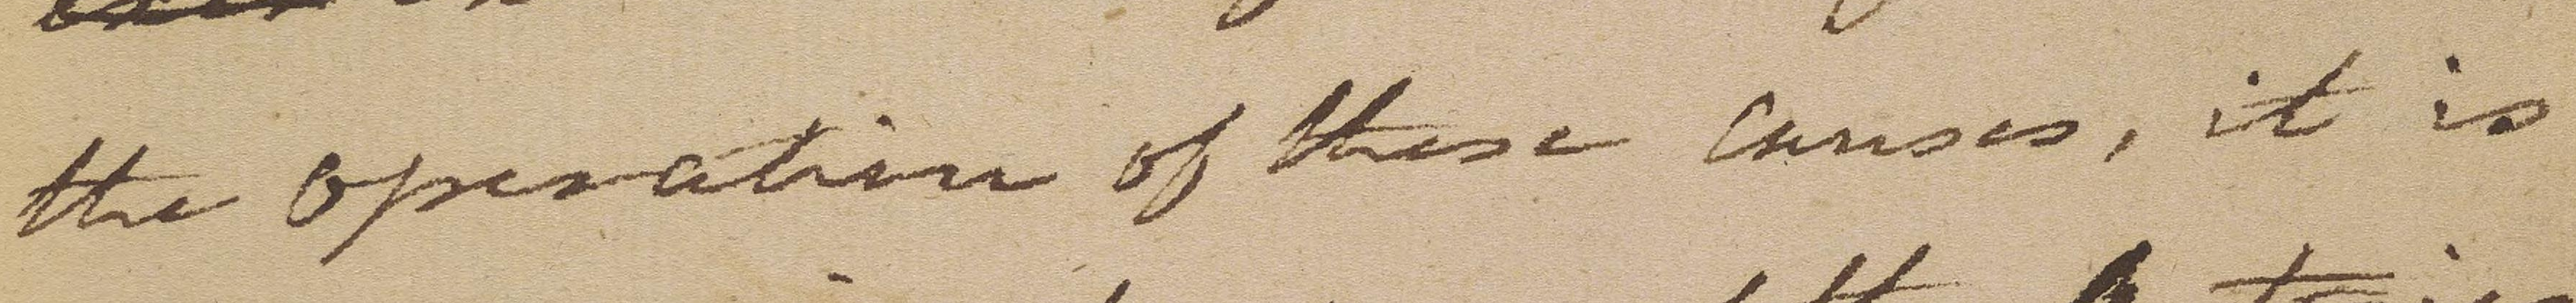the operation of these causes, it is
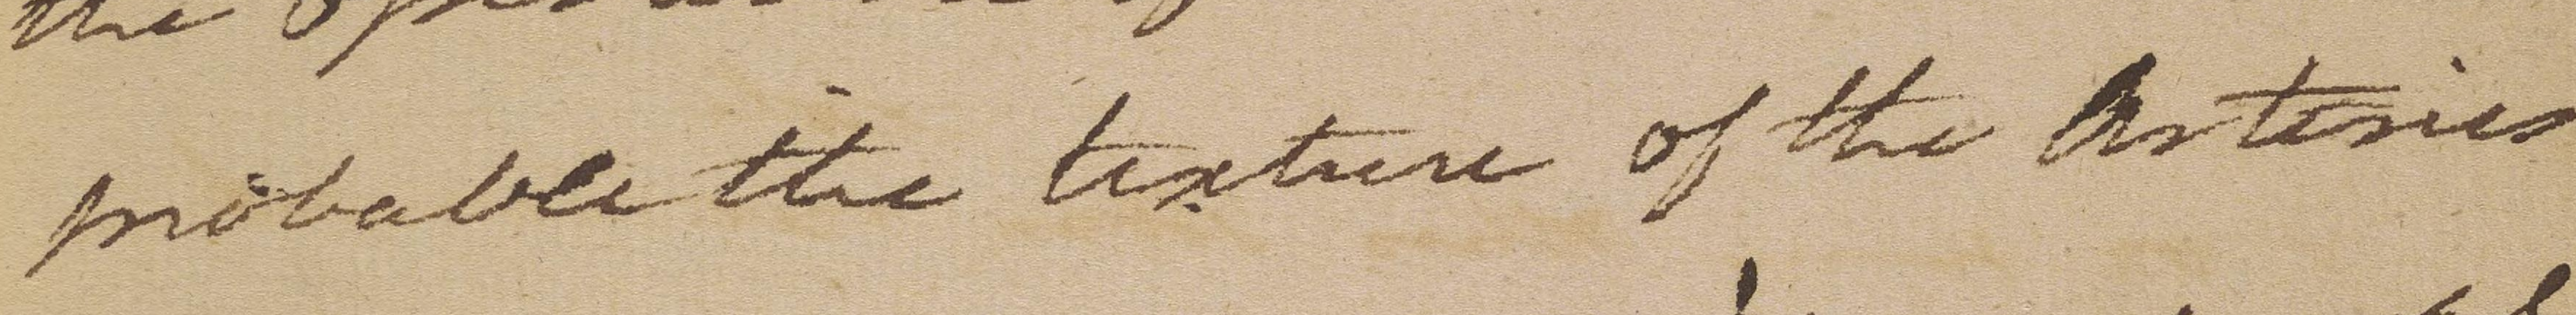notable the texture of the Arteries
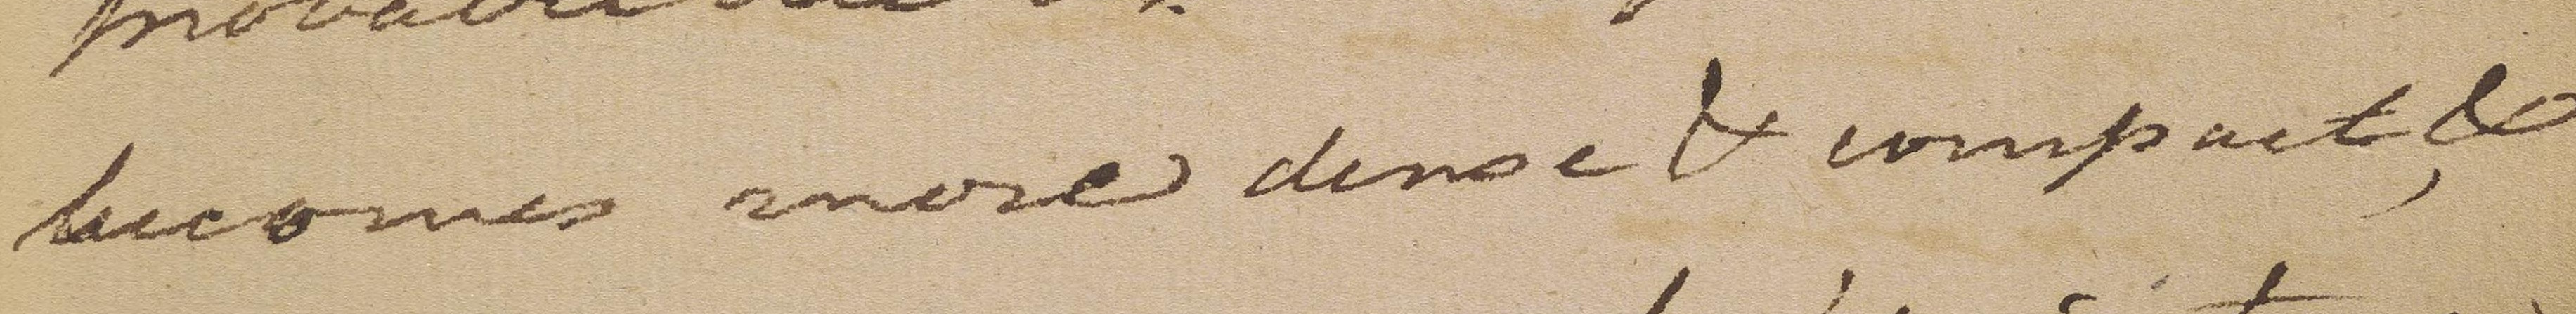becomes more dense & compact &
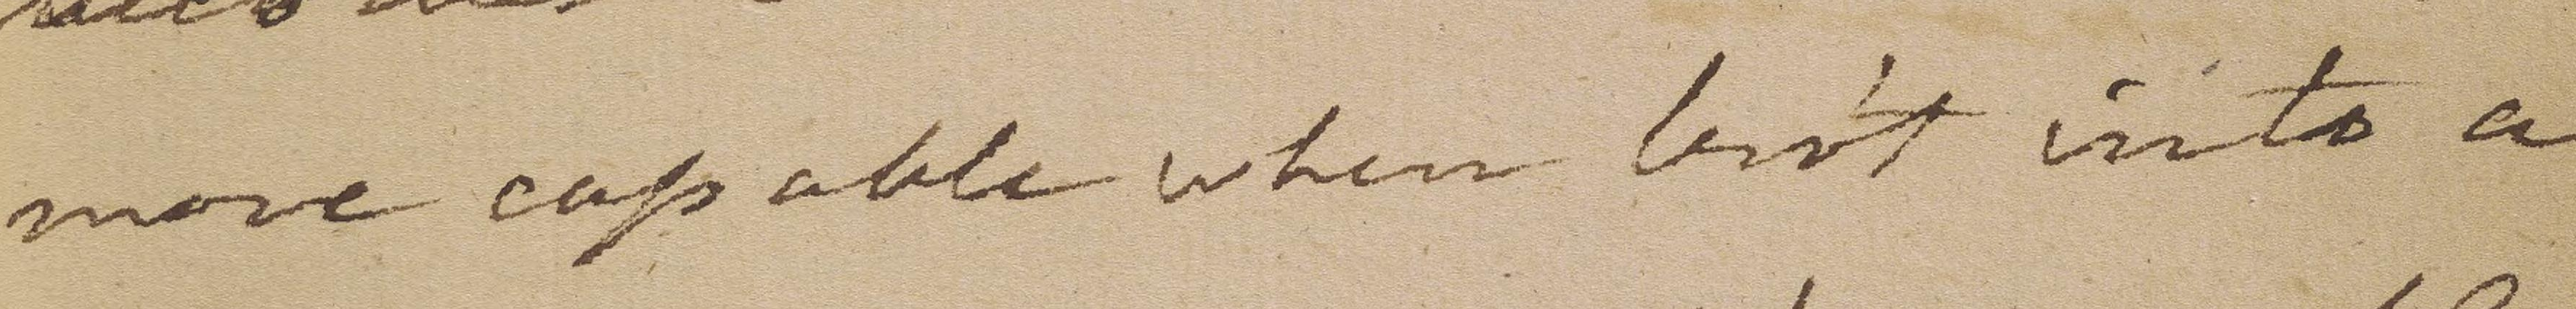more capable whe bro't into a
